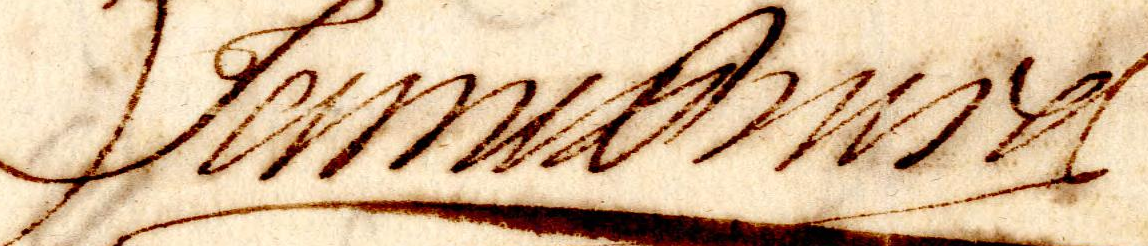James Burd
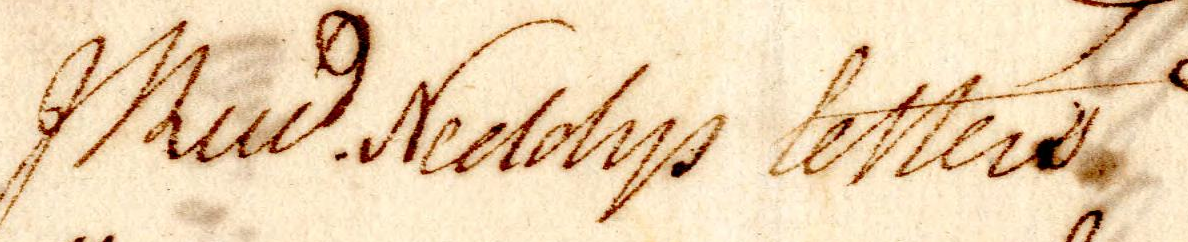I Reced. Neddys letters
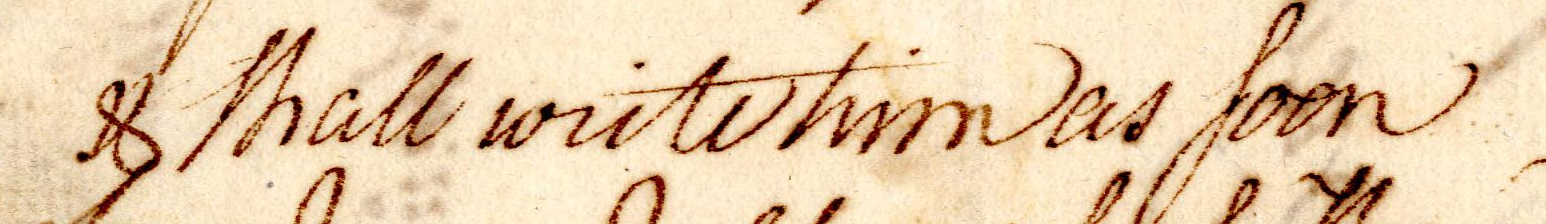& shall write him as soon
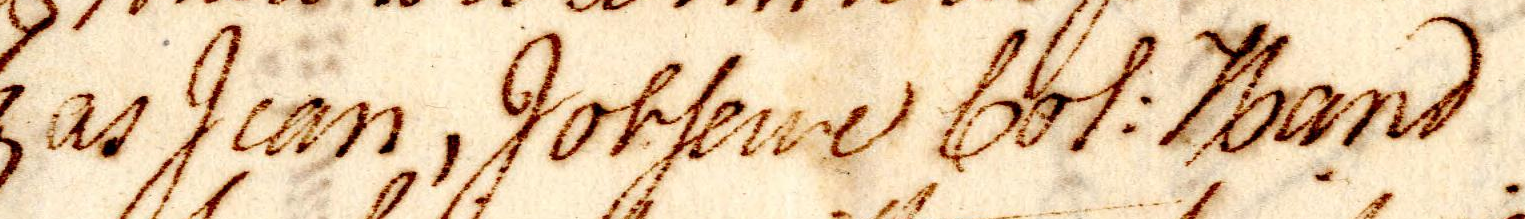as I can, I observe Col: Hand
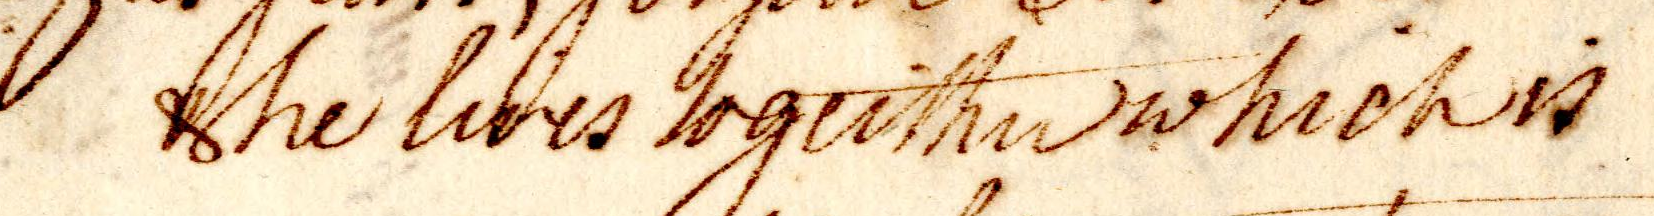& he lives together which is
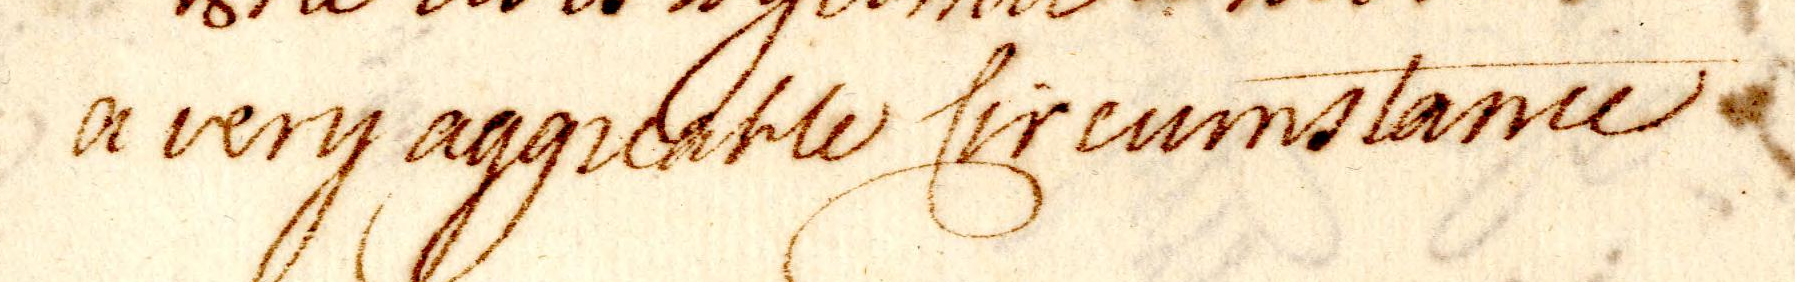a very aggreable Circumstance
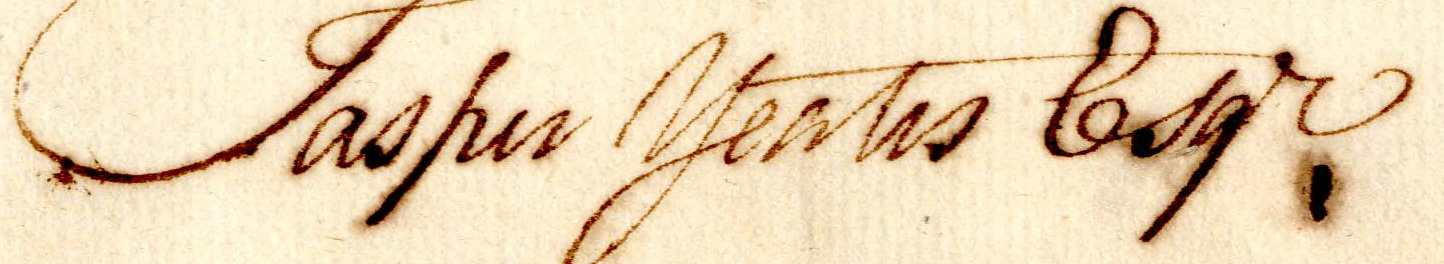Jasper Yeates Esq^r
